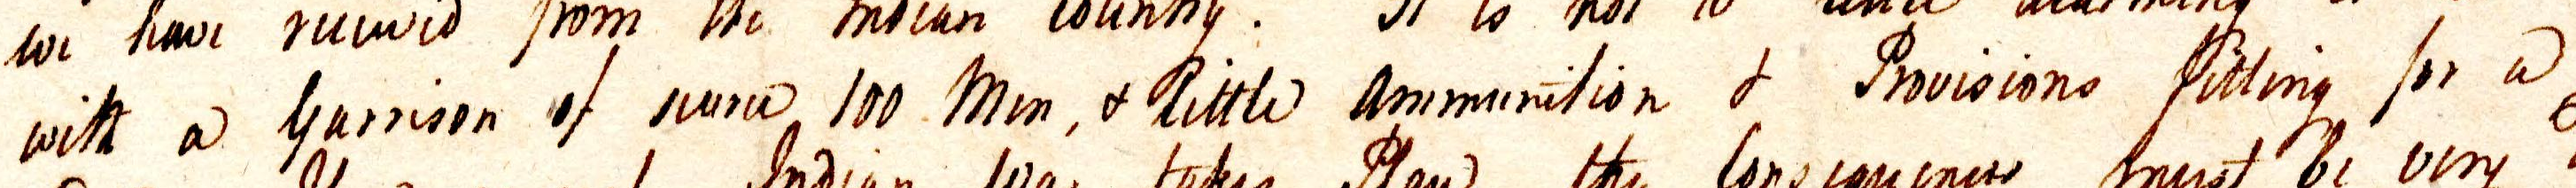with a Garrison of near 100 Men, & little ammunition & Provisions Sitting for a
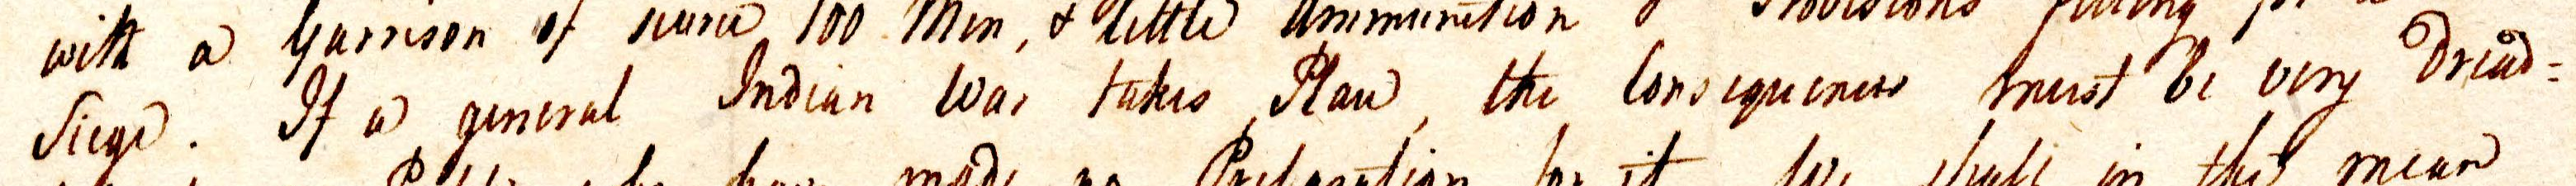Siege. If a general Indian war takes Place, the Consequences must be very dread-
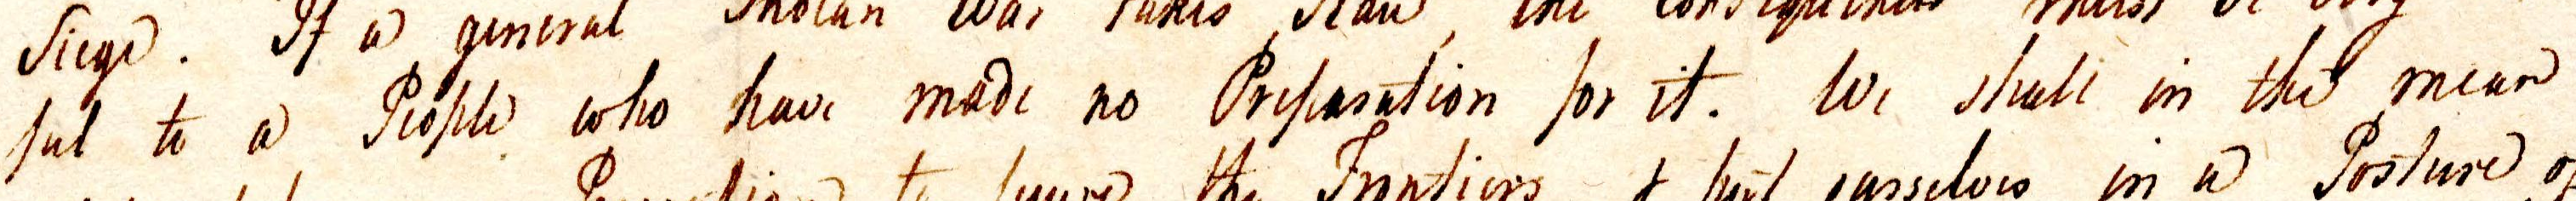ful to a People who have made no Preparation for it. We shall in the mean
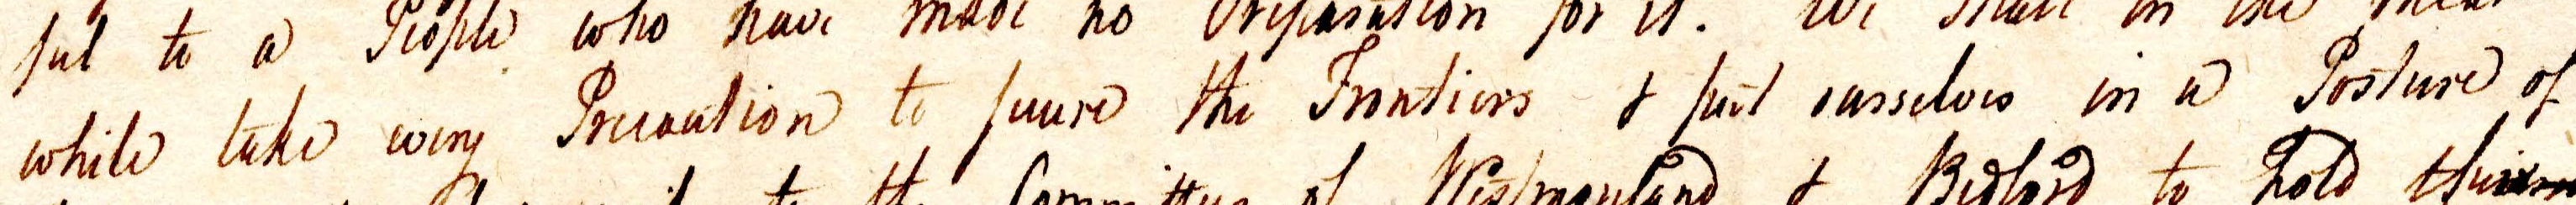while take every Precaution to secure the Frontiers & put ourselves in a Posture of
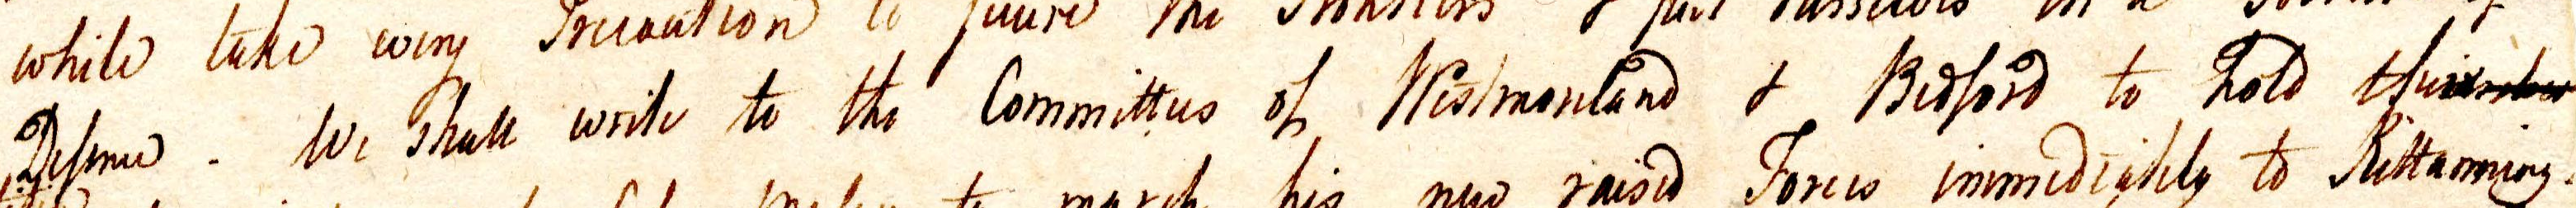Defence. We shall write to the Committees of Westmoreland & Bedford to hold [____]
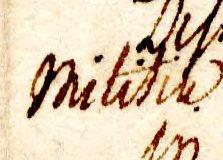Militia.
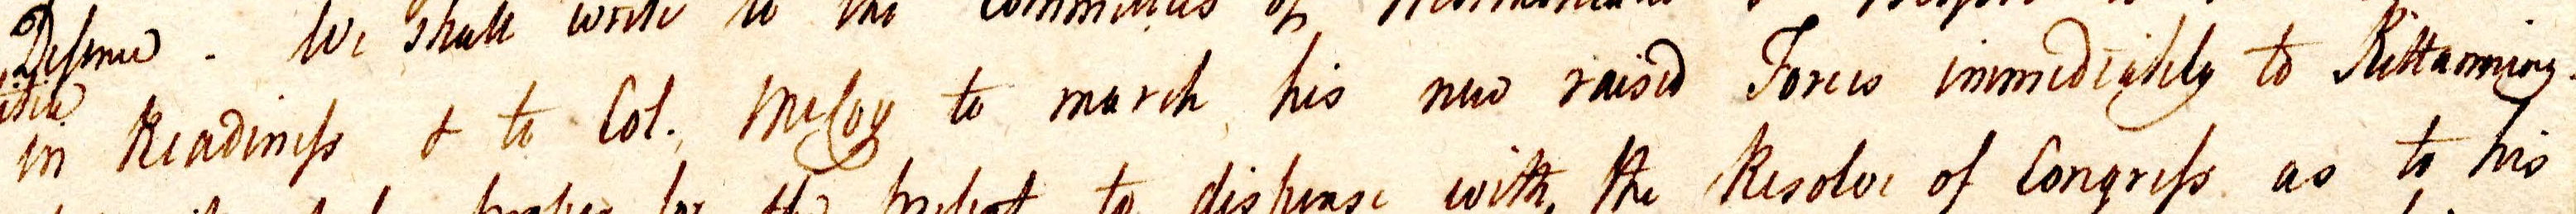^ in Readiness & to Col. Meloy to march his new raised Forces immediately to Kittanning.
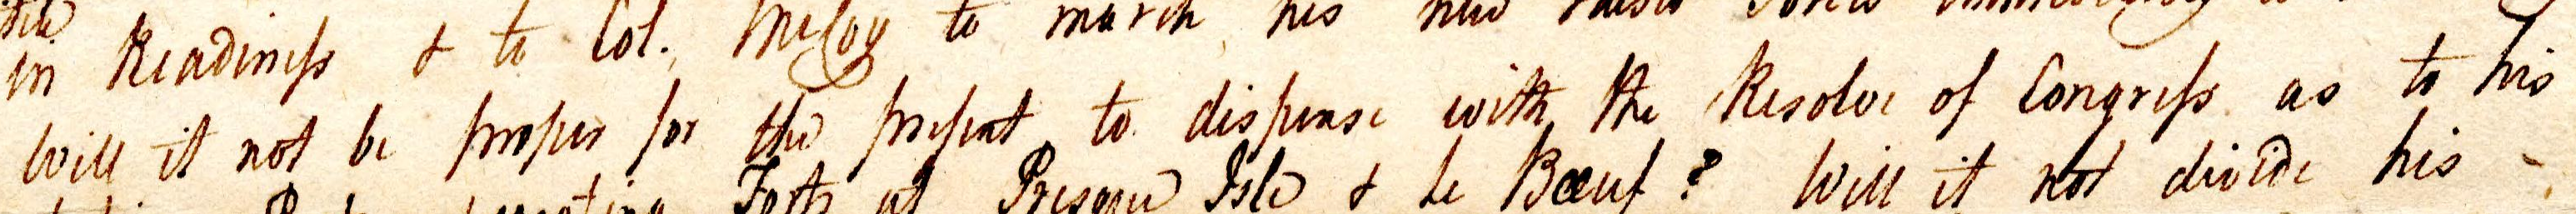Will it not be proper for the present to dispense with the Resolve of Congress as to his
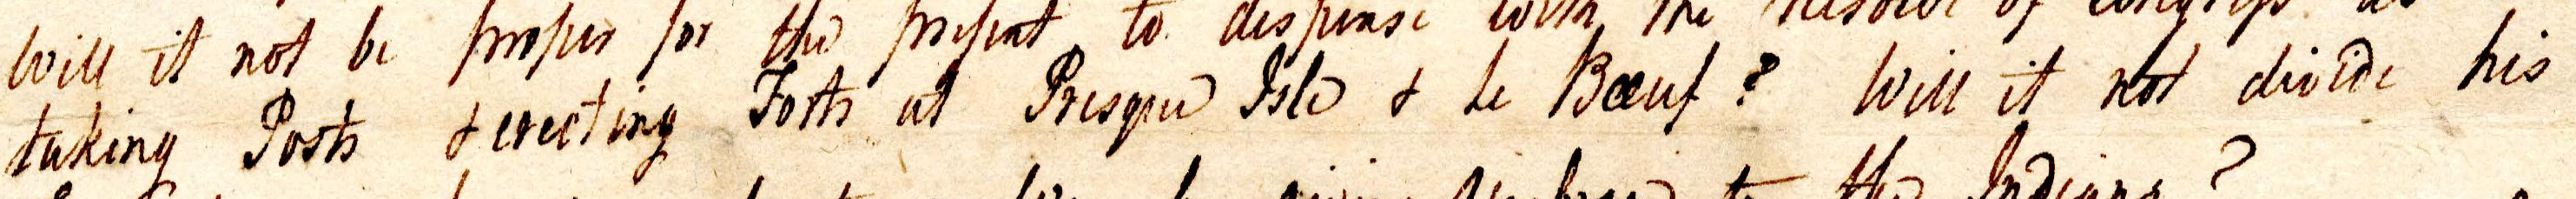taking Posts & erecting Forts at Presque Isle & Le Boeuf? Will it not divide his
